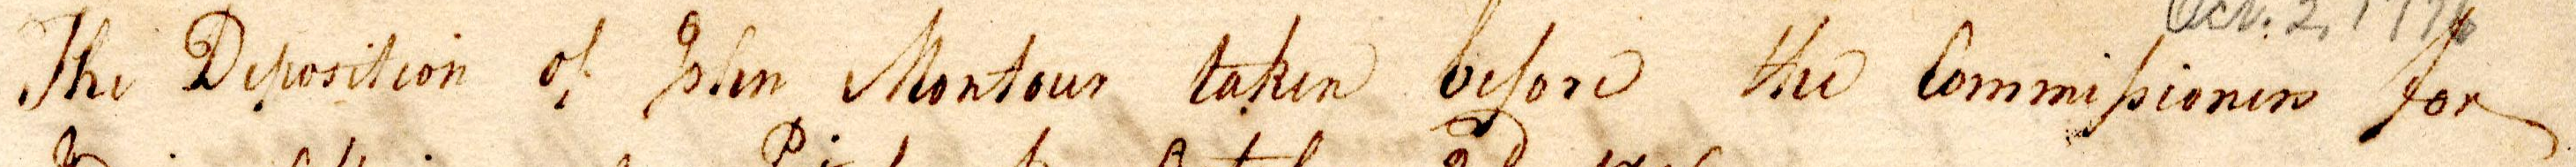The Deposition of John Montour taken before the Commissioner for
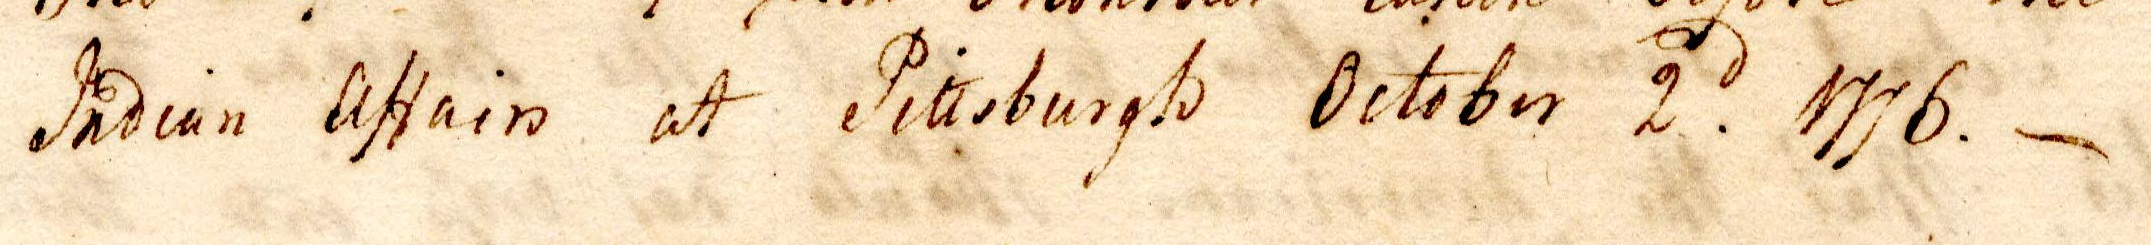Indian Affairs at Pittsburgh October 2^d. 1776.
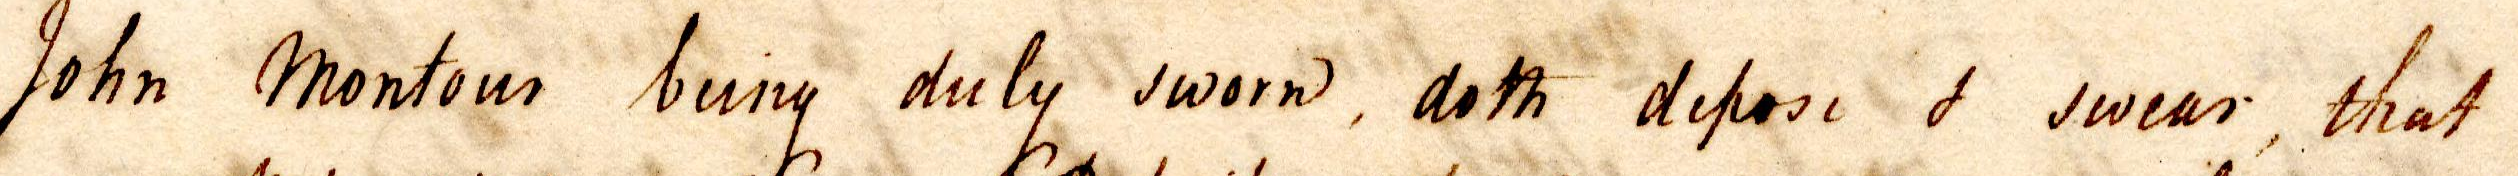John Montour being duly sworn, doth depose & swear, that
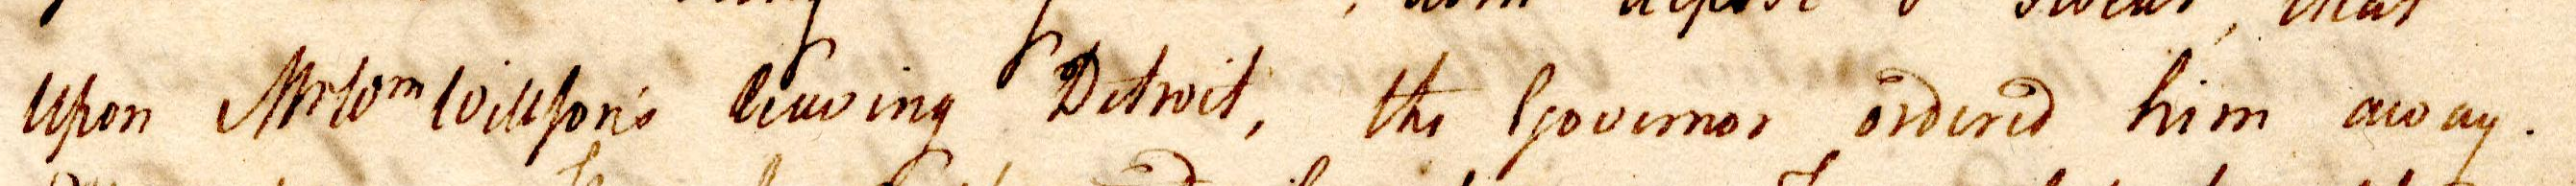upon M^r W^m Willson's leaving Detroit, the Governor ordered him away.
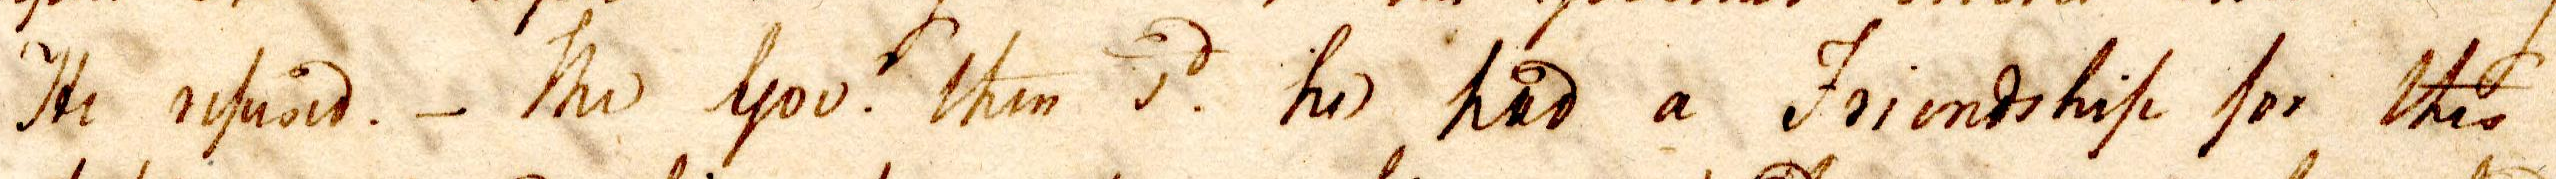He refused.- The Gov^r. then s^d. he had a Friendship for this
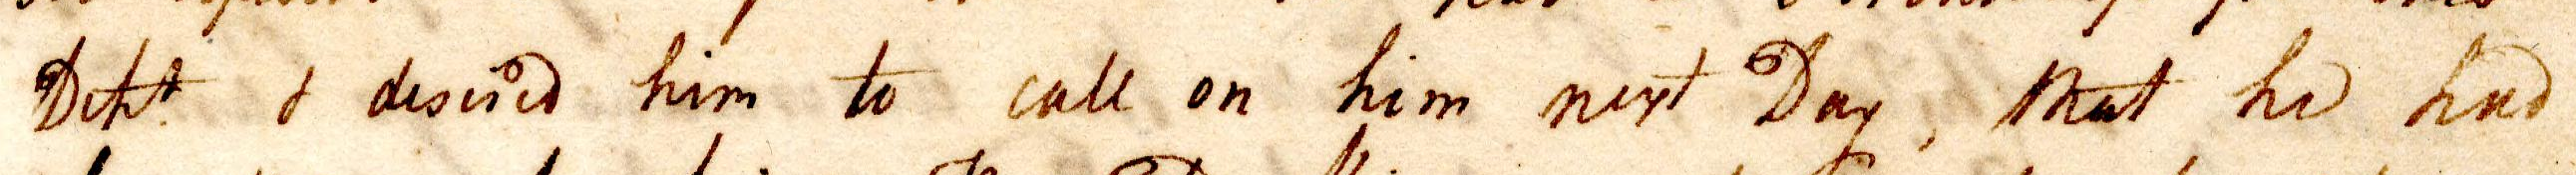Dep^t. & desired him to call on him next Day, that he had
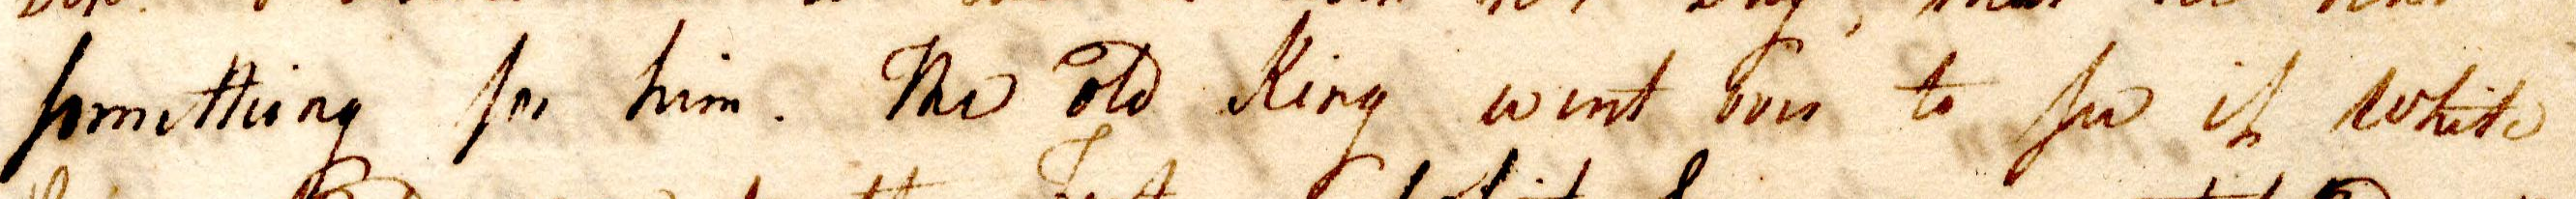something for him. The old King went over to see if white
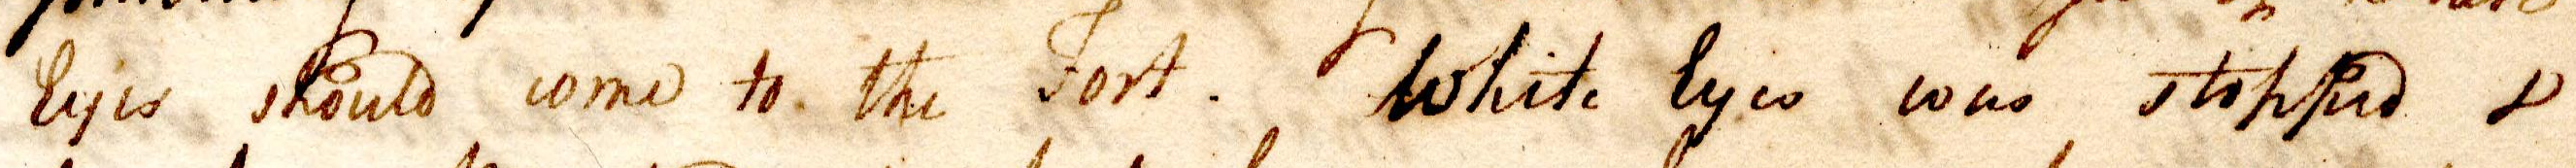Eyes should come to the Fort. White Eyes was stopped &
